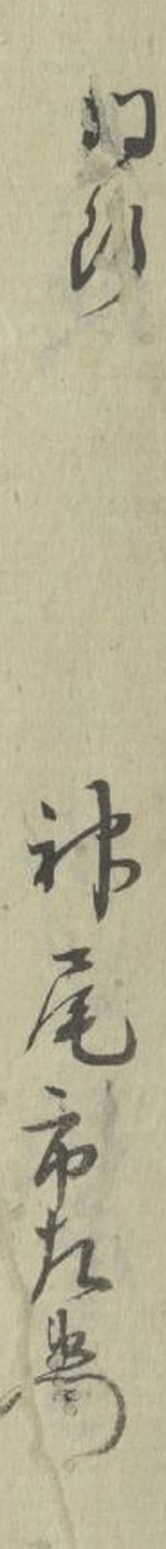同断神尾市左衛門
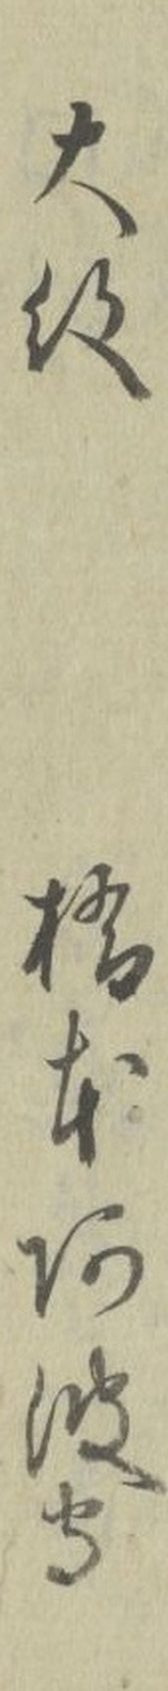大紋橋本阿波守
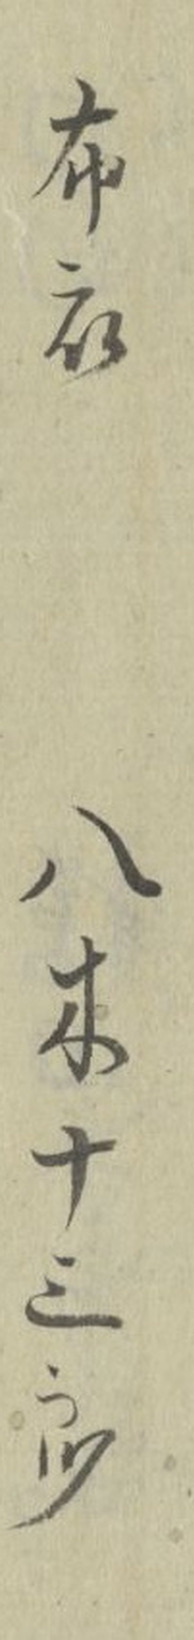布衣八木十三郎
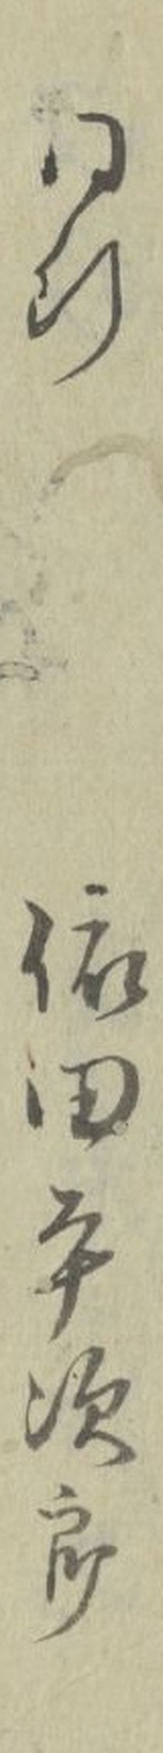同断依田平次郎

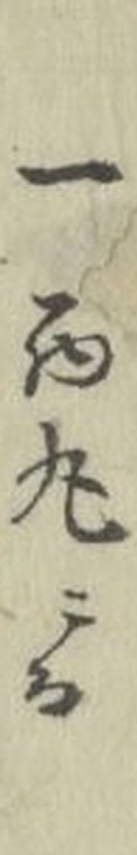一西丸に而
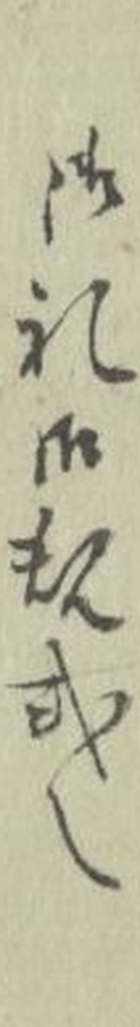御礼御規式之
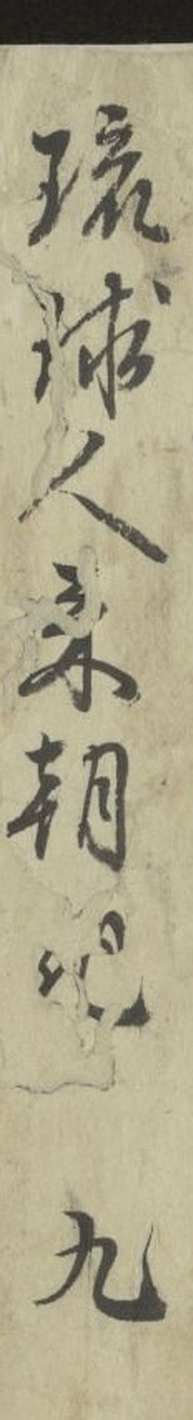琉球人来朝記九
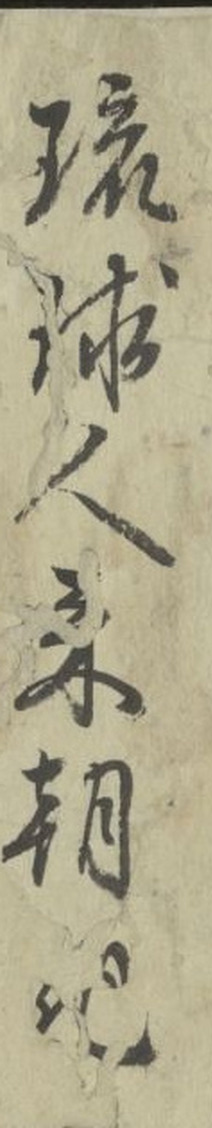琉球人来朝記九

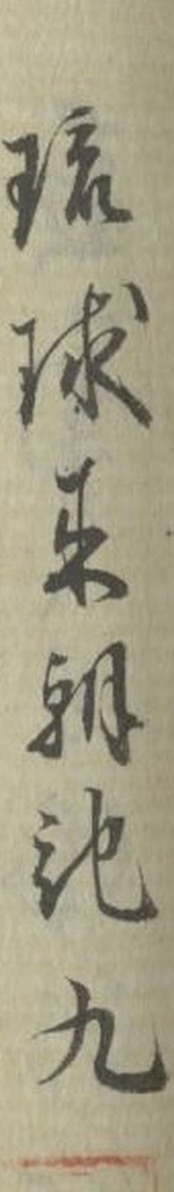琉球来朝記九
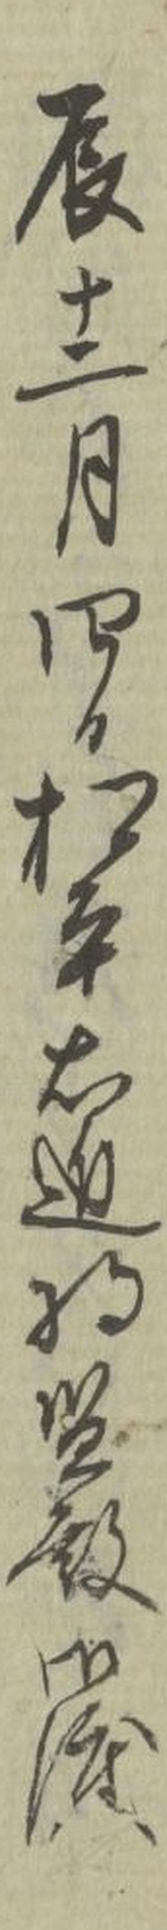辰十二月四日松平右近将監殿御渡
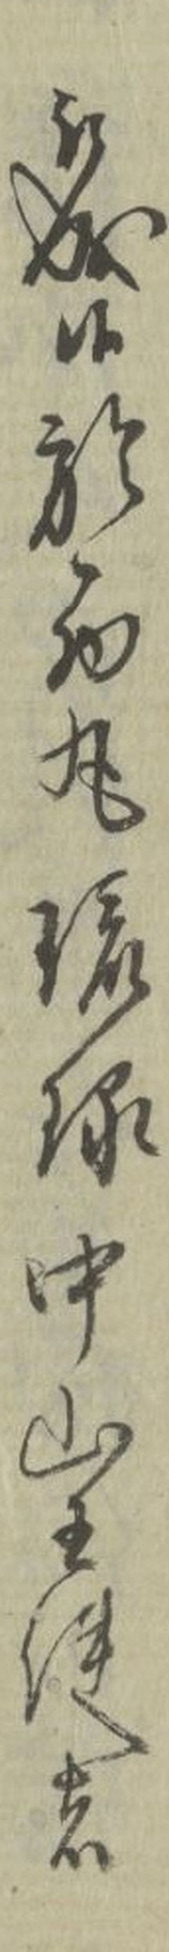被成候於西丸琉球中山王使者
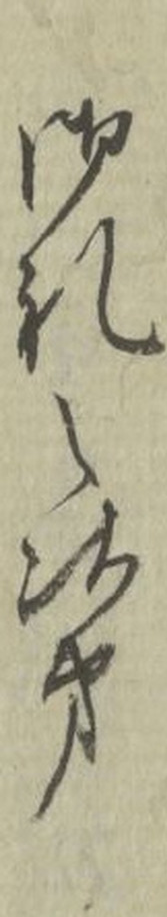御礼之次第

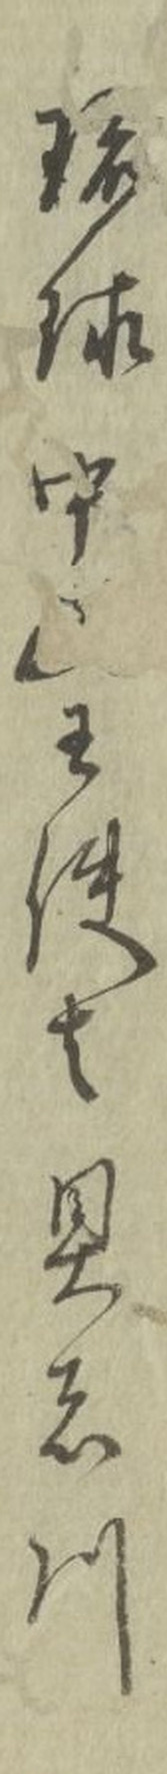琉球中山王使者具志川
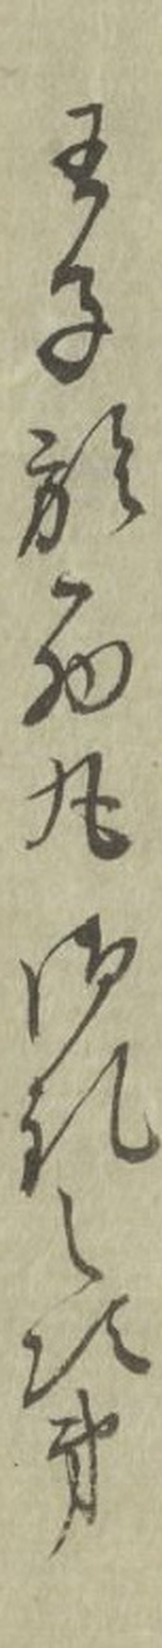王子於西丸御礼之次第
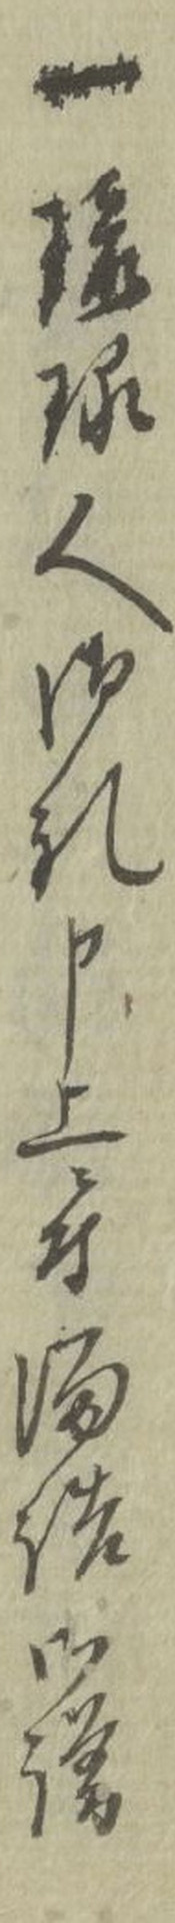一琉球人御礼申上に付溜詰御譜
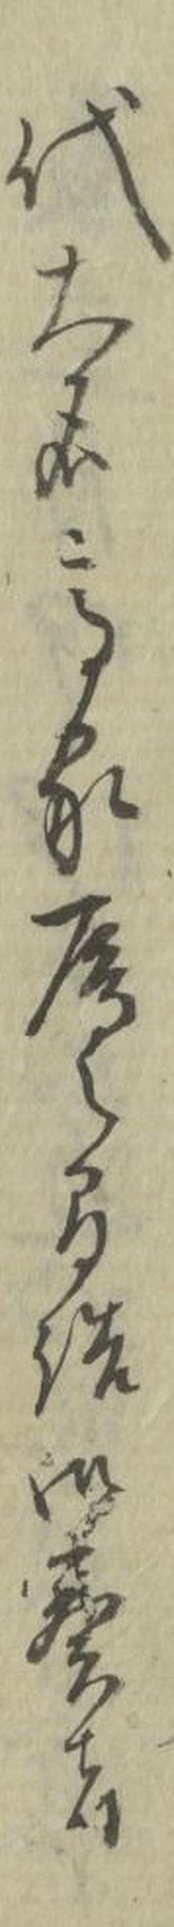代大名高家雁之間詰御奏者
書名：琉球来朝記 自八至十四終
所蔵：University of the Ryukyus Library
